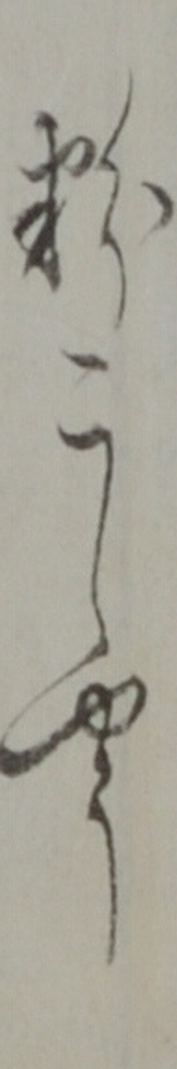粉こしやう
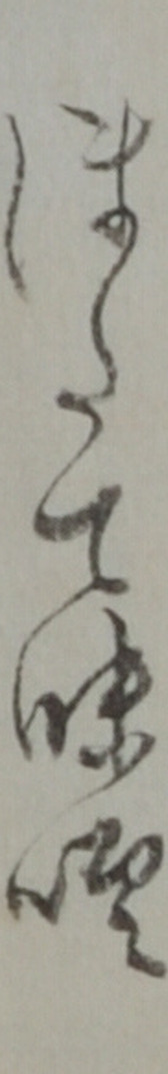ほたて味噌
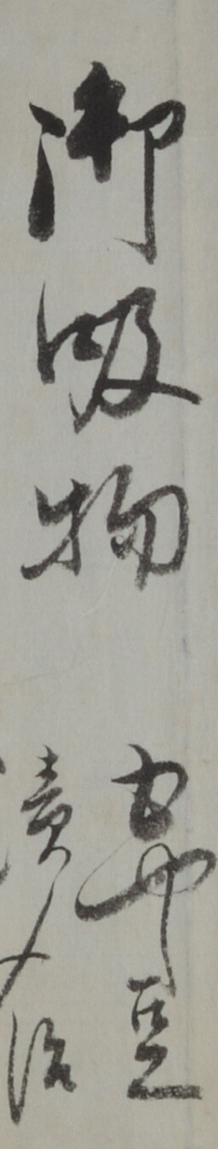御吸物もやし豆
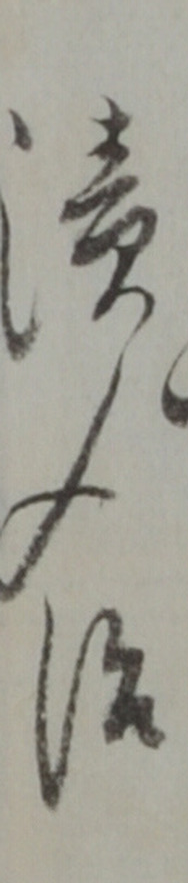漬〆じ
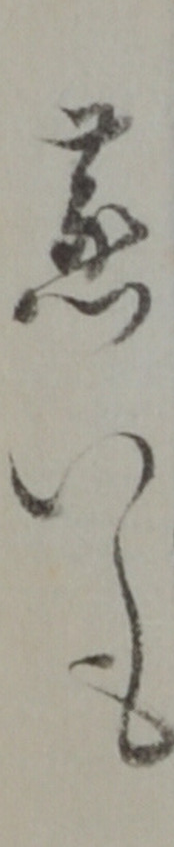蒸いも
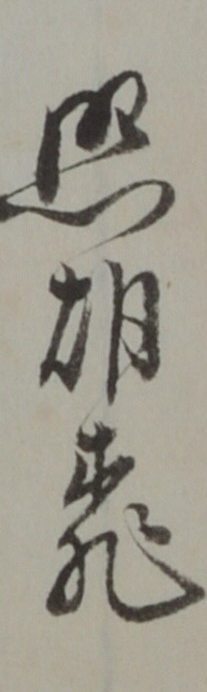照胡桃
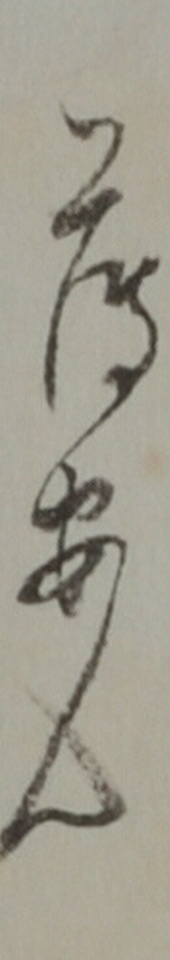薄あん
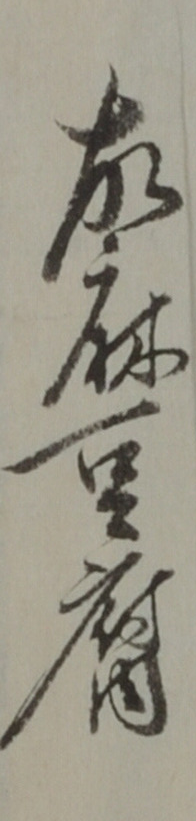胡麻豆腐
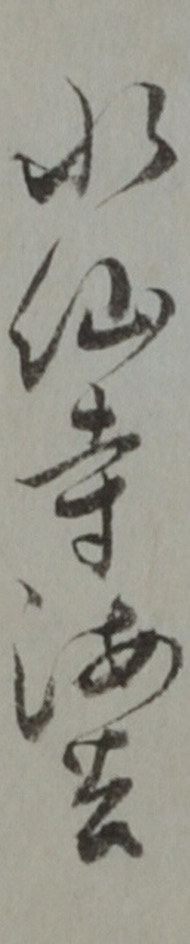水仙寺海苔
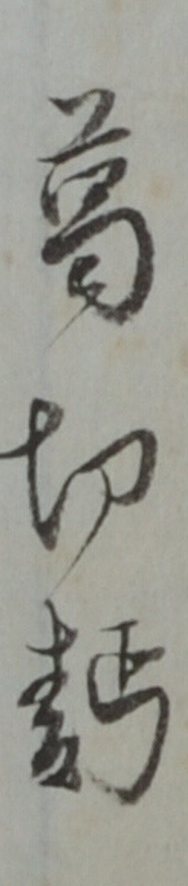葛切麺
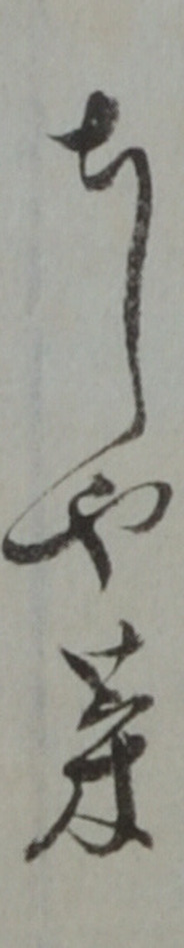ちしや菜
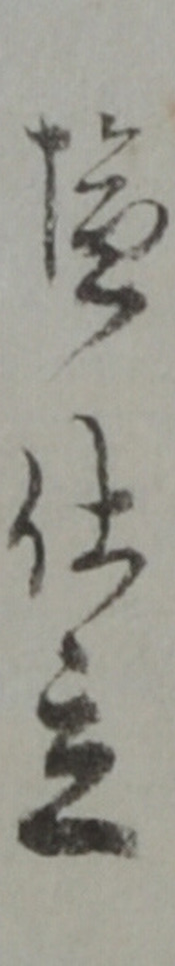塩仕立
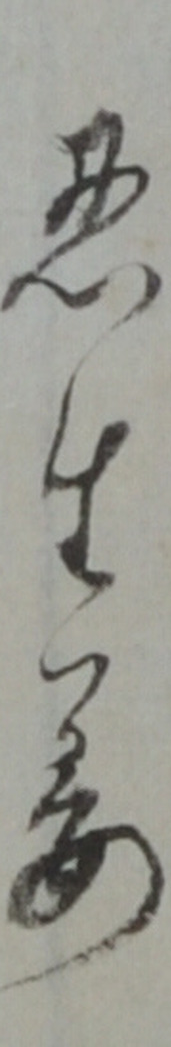忍生姜
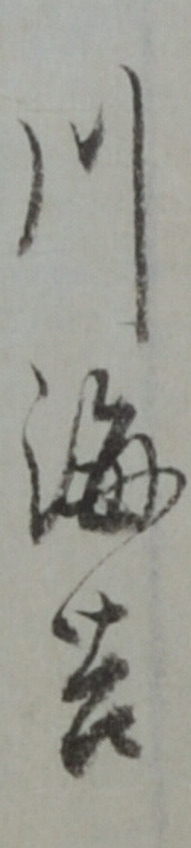川海苔

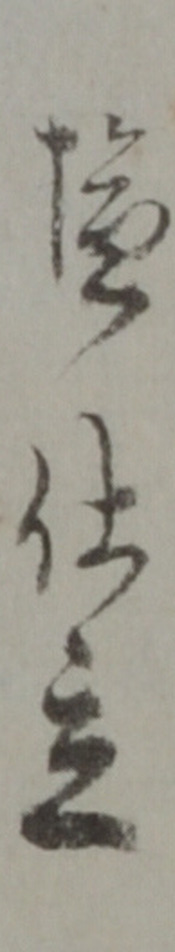塩仕立
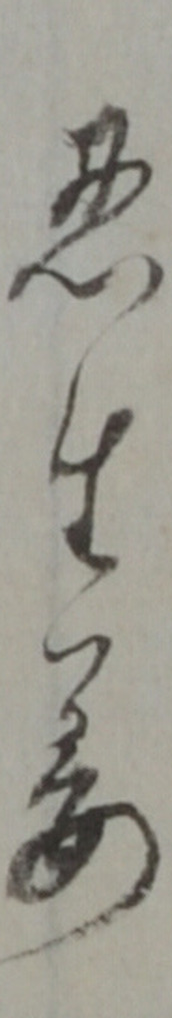忍生姜
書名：献立書上
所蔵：伊那市立高遠町図書館・合同会社AMANE
